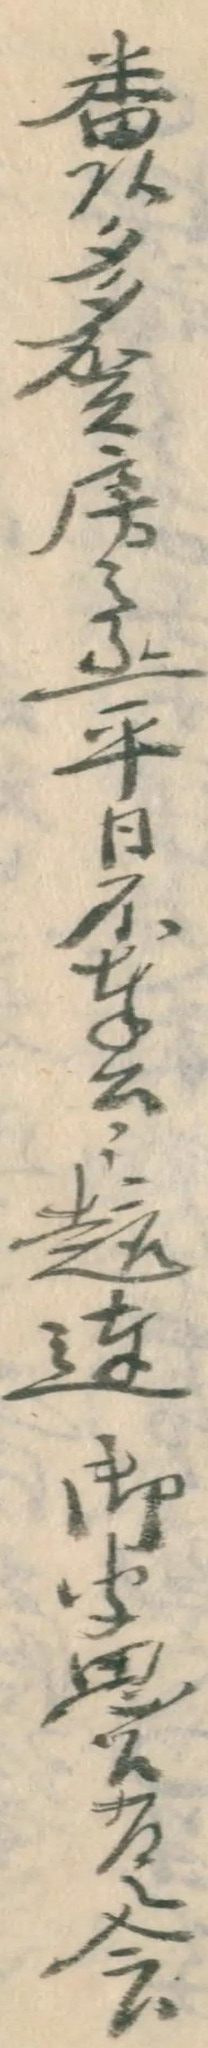番頭多賀房之丞平日不奉公之趣達御聞思召有之今日
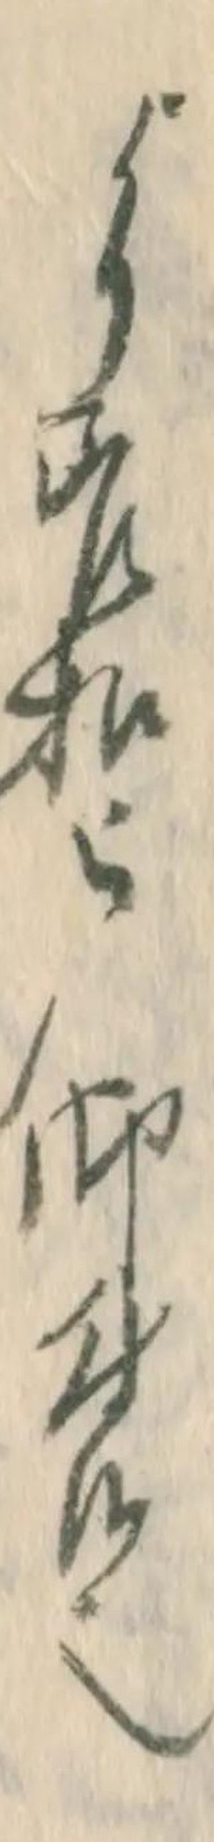より差被仰付候也
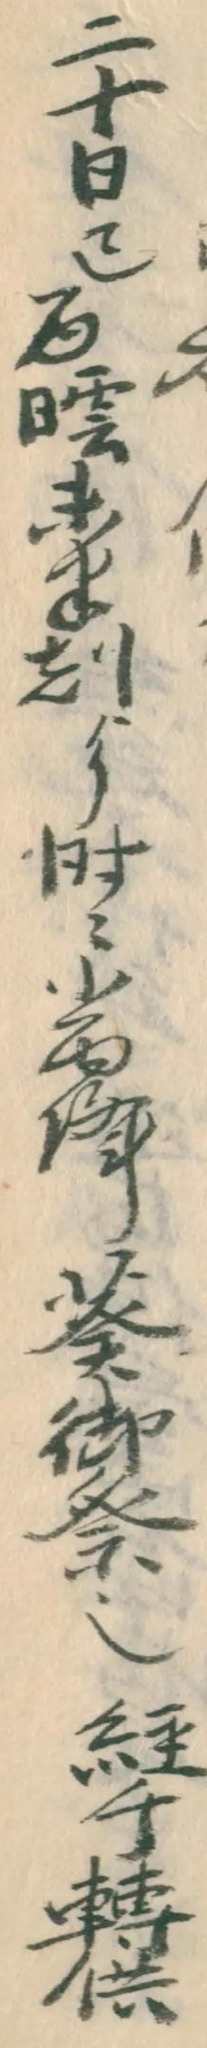二十日乙酉曇未半刻より時々小雨降葵御祭也経千轉供

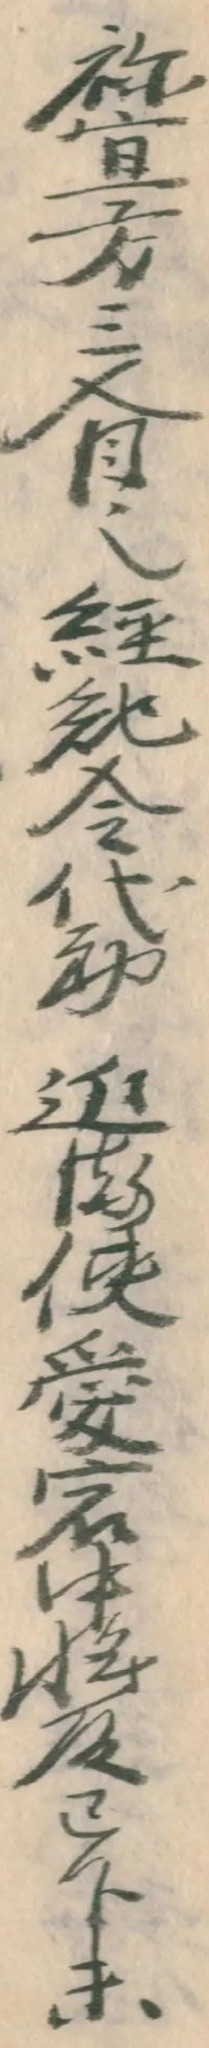祢宜方三人目也経紀令代勤近衛使愛宕中将殿已下未
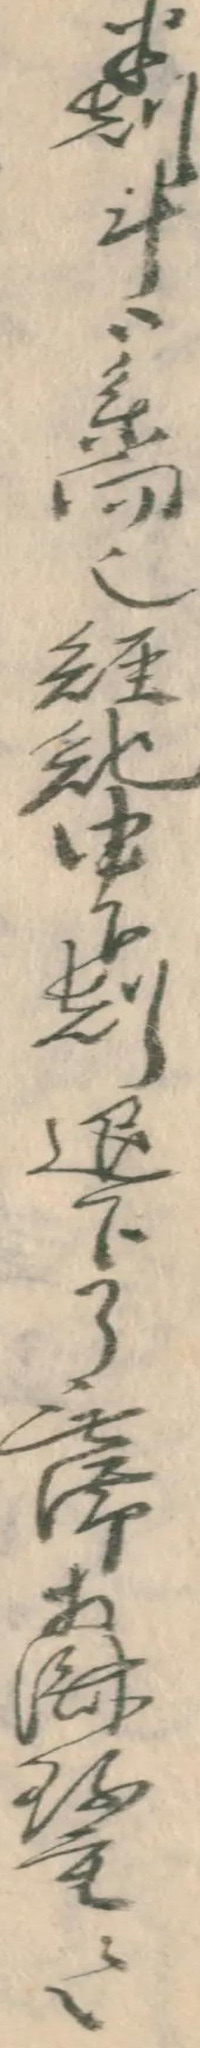半刻斗御参向也経紀申下刻退下了無滞相済珍重々々
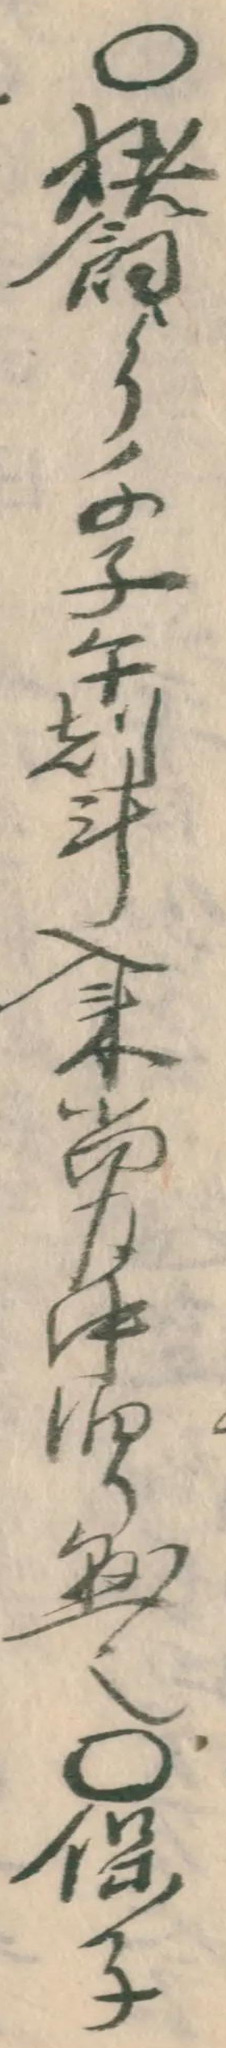○猪飼より千午刻斗入来當月中泊り懸也○保子
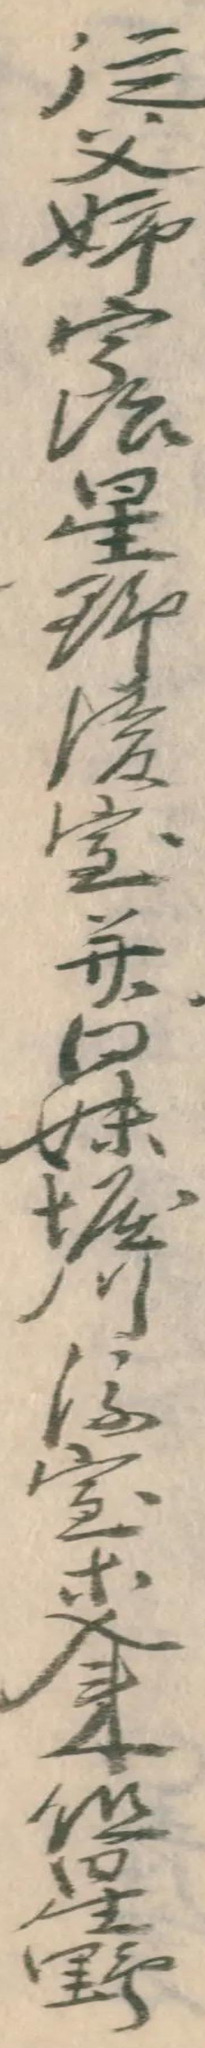従父姉宇治星野後室并同妹堀川後室等入来但星野
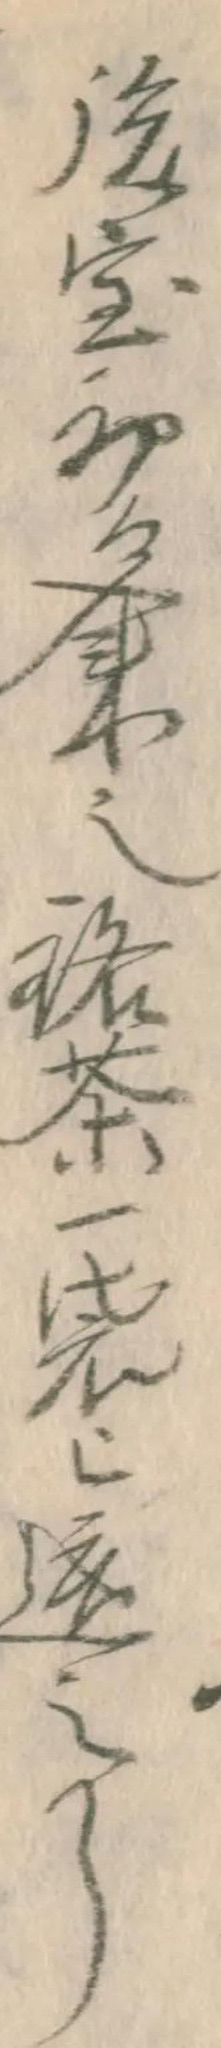後室初而入来也銘茶一袋被送之了
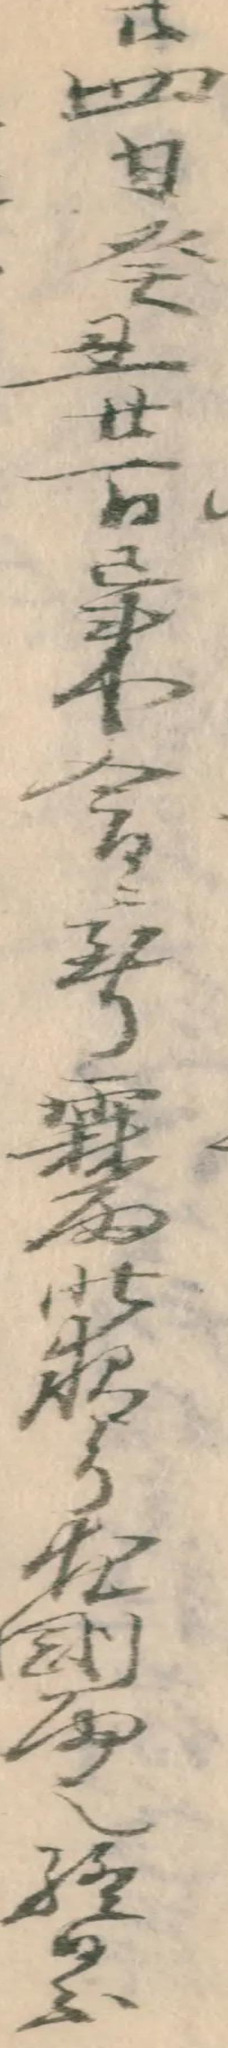廿四日癸丑廿一日已来今日ニ至リ霖雨昨夜より尤剛雨也終日不
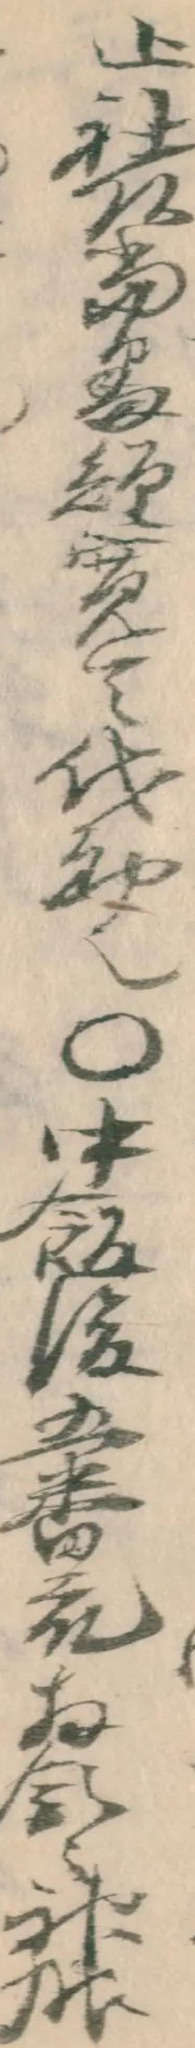止社頭當番経寛令代勤也○中飯後五番衆拝領之神服
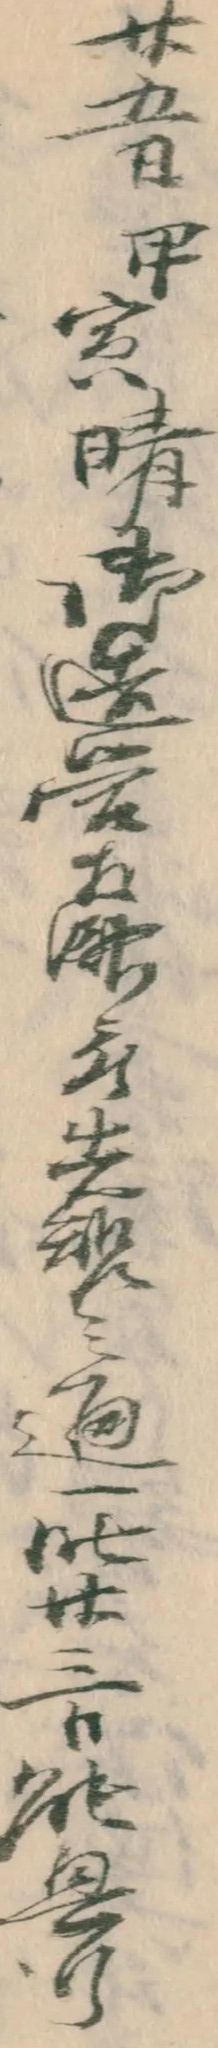廿五日甲寅晴御造営相済ニ付先規之通一昨廿三日能興行
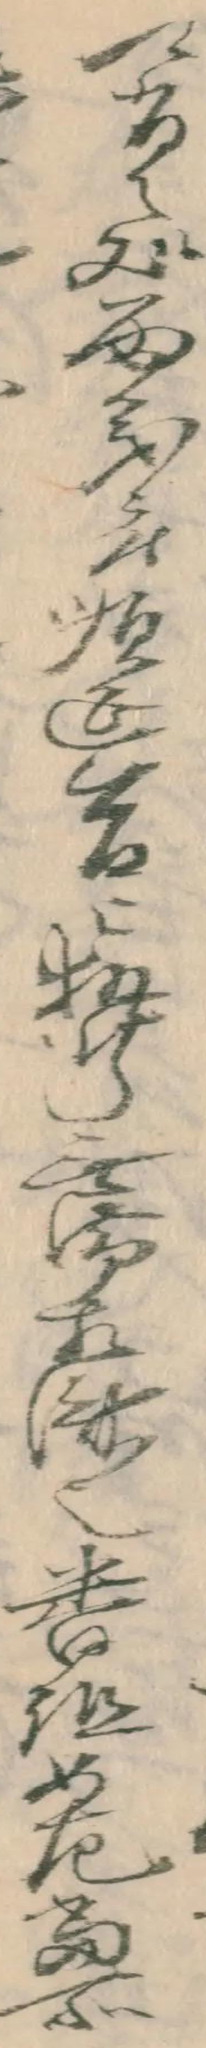可有之処雨義ニ付順延今日被執行無滞相済也番組如左當所
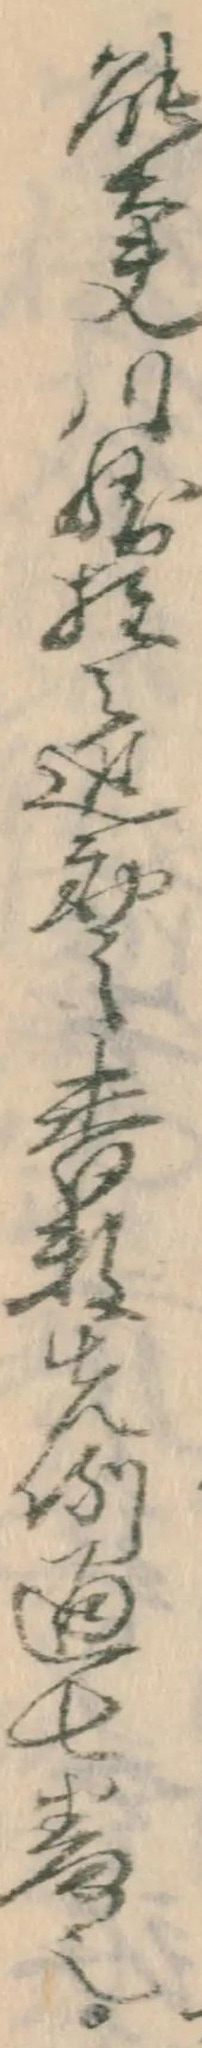能太夫川勝、孫之進勤之番数先例通七番也
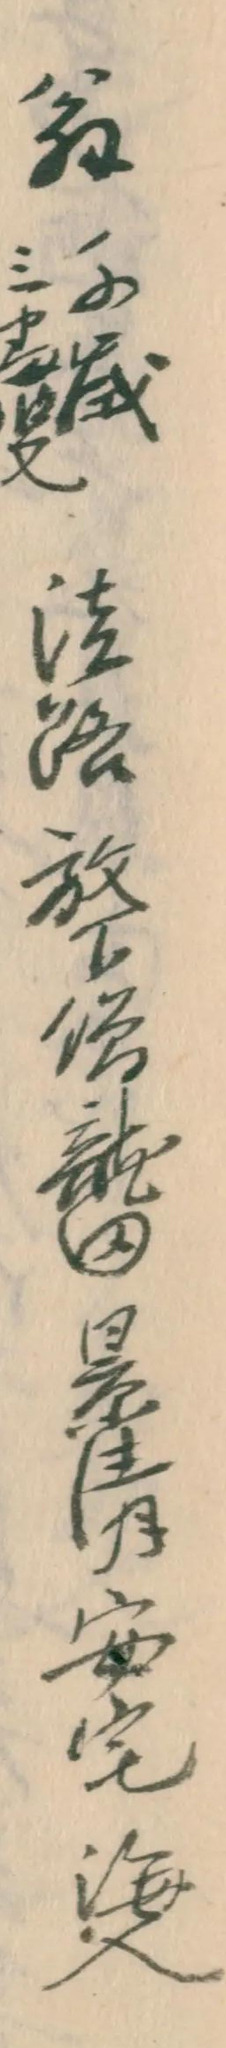翁千歳三番法路放下僧龍田景清安宅海入
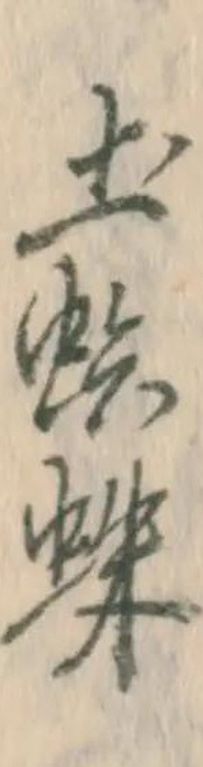土蜘蛛
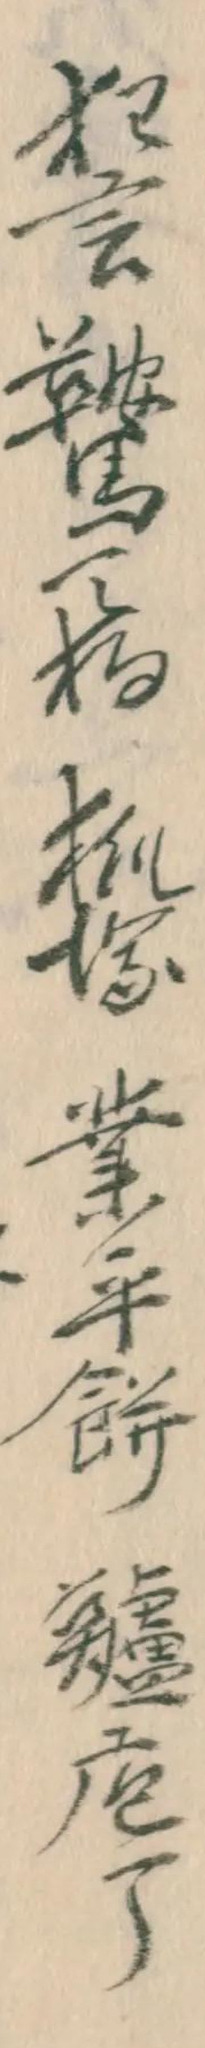狂言鞍馬天狗狐塚業平餅鱸庖丁
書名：賀茂社記録. 第67冊
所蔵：国立国会図書館 National Diet Library, JAPAN
